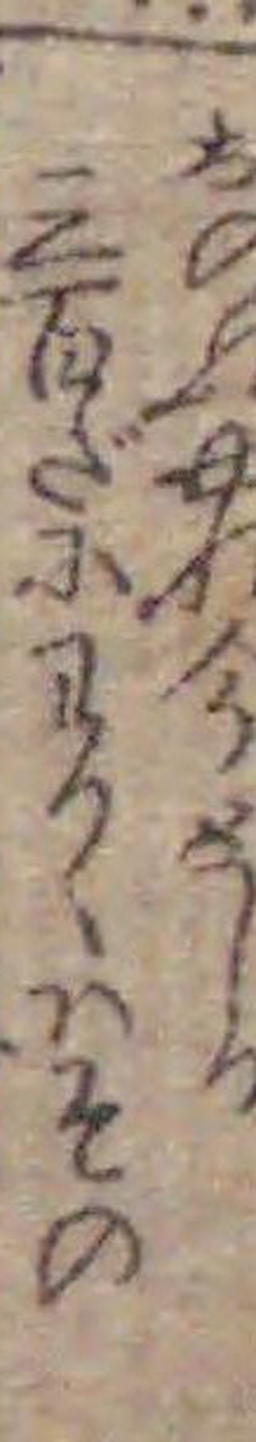三百だにわかくはその
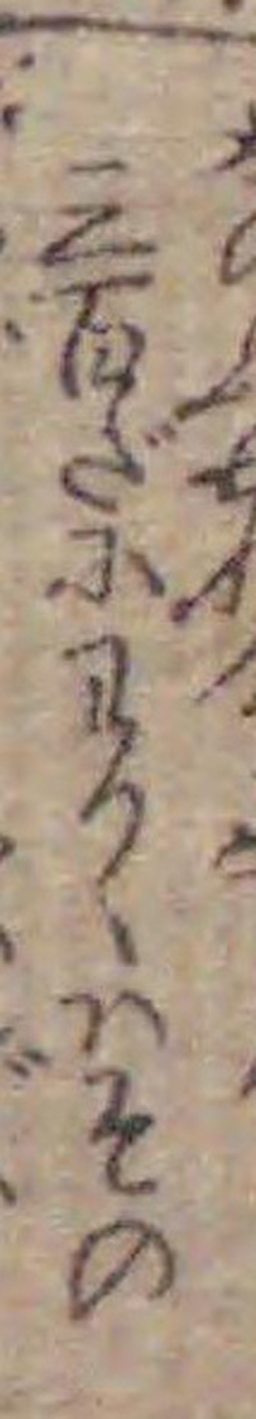三百だにわかくはその
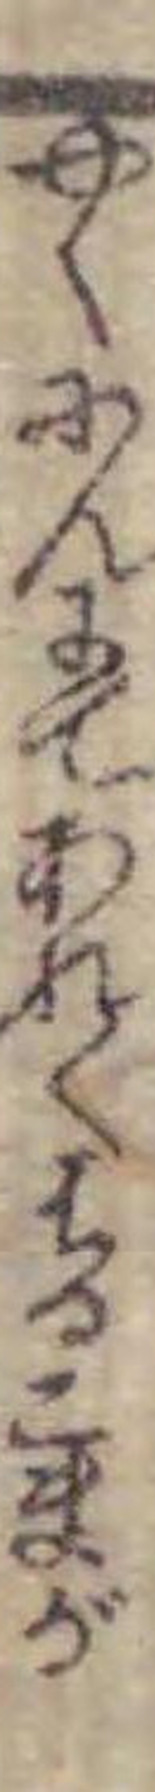やくにんにてあれ〳〵はるこまが
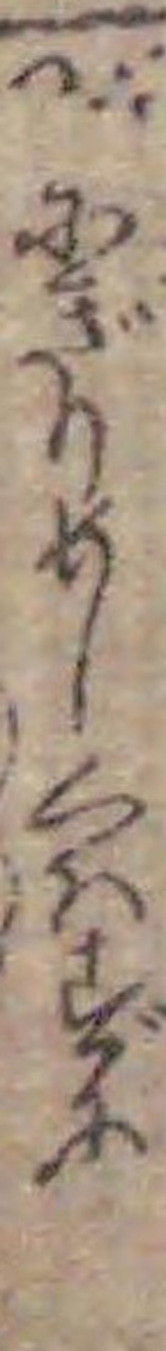にぎりめしくはずに
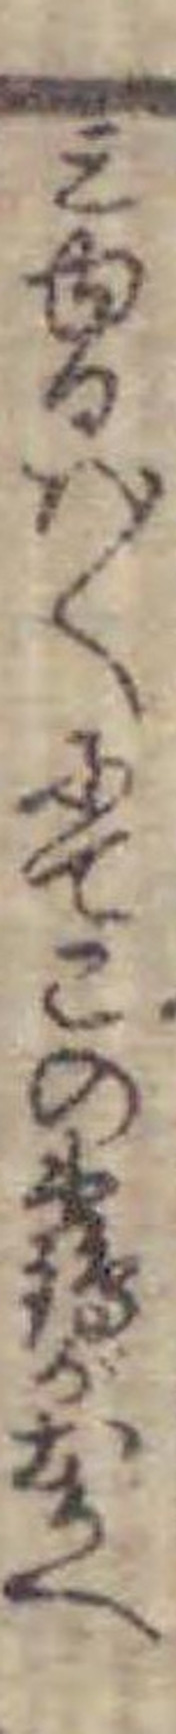みゆるばくにてこの鶴がおかへ
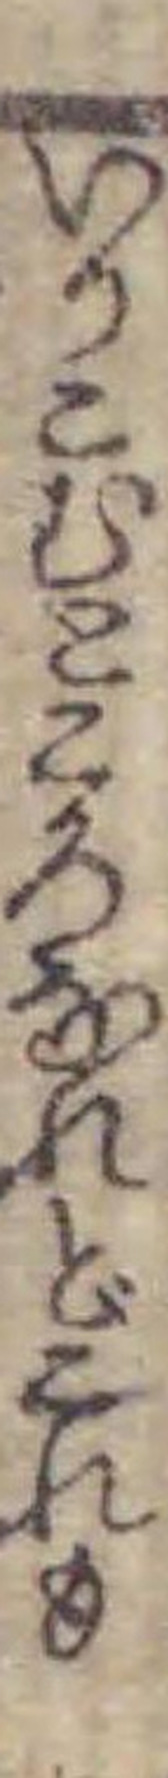いりこむところなれどこれも
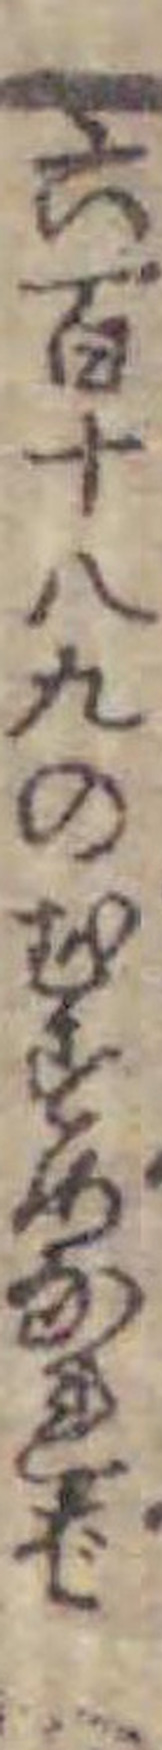六百十八九のむすめなれば
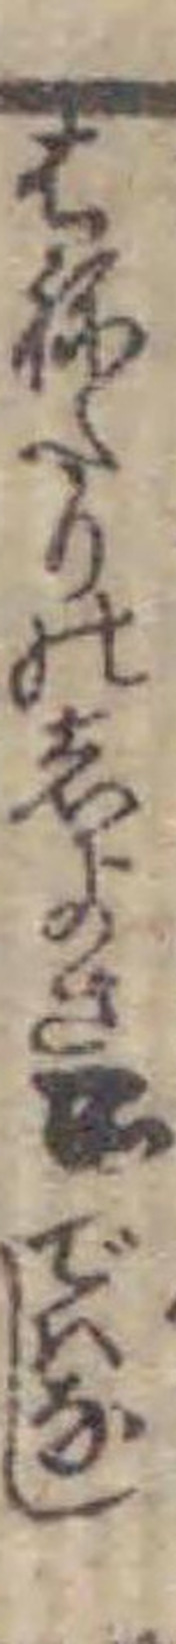はねたりのしよさ所ではなし
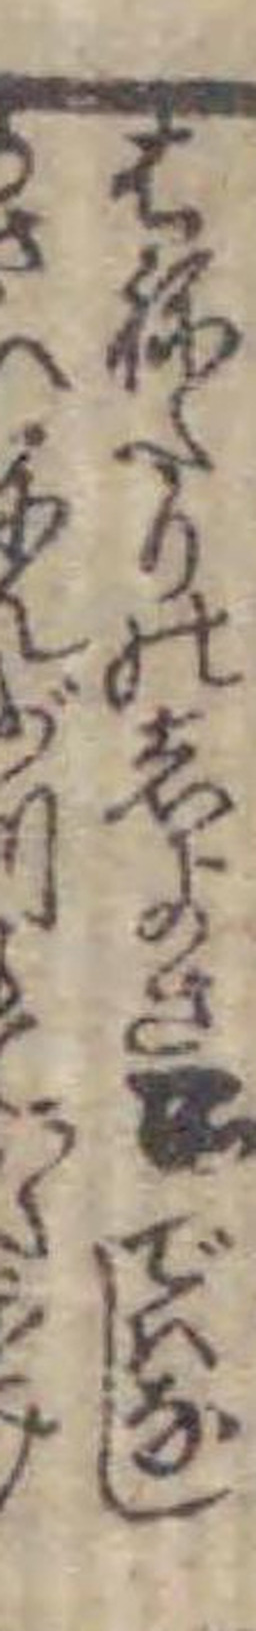かさいねんぶつにておたすけ
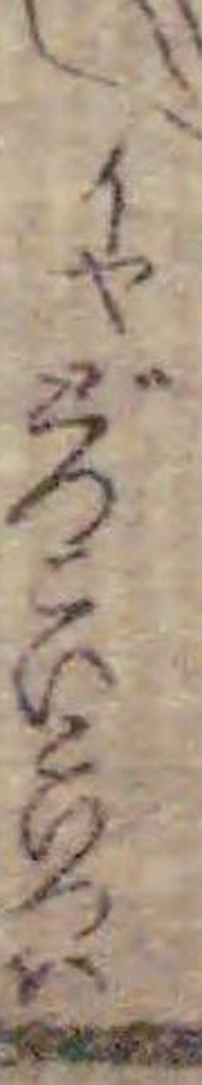イヤどつこいこいつは
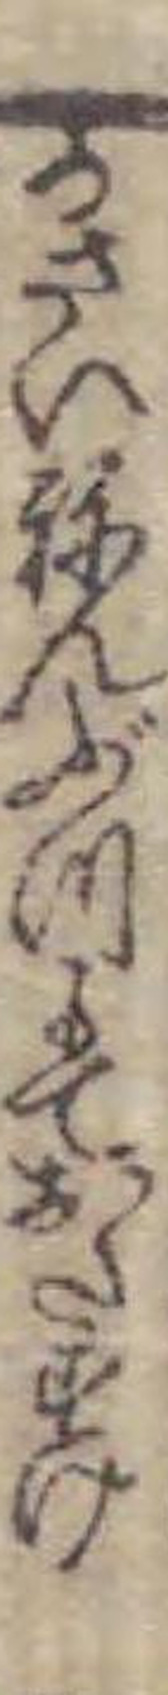かさいねんぶつにておたすけ
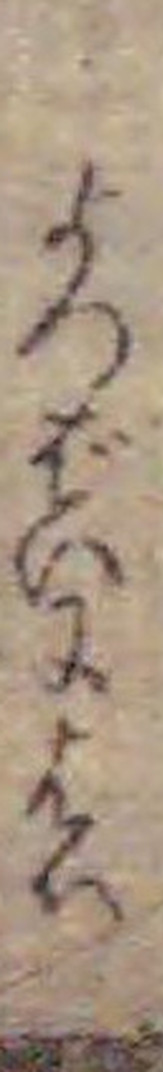よつばいにはい
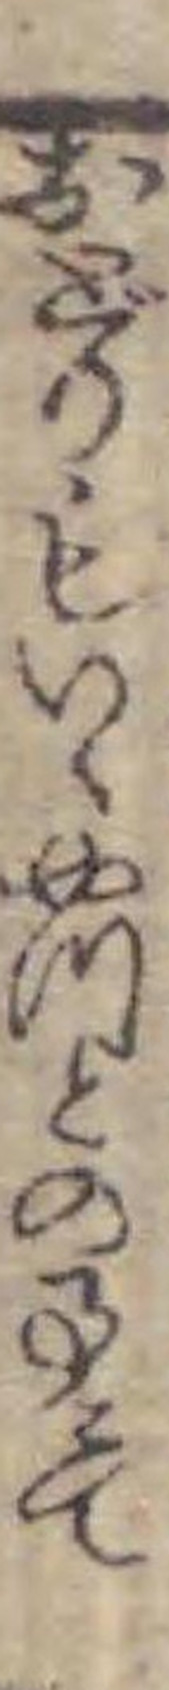おどりもいゝやつとの事にて
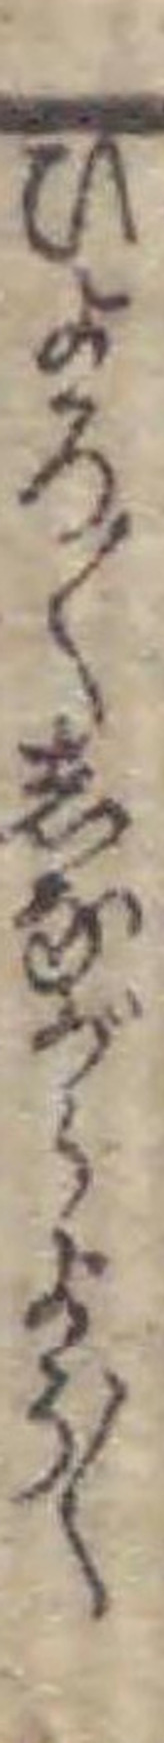ひよろ〳〵しながらよう〳〵
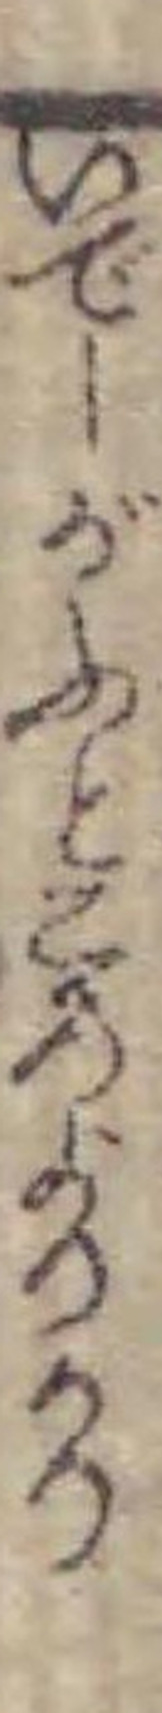いでしがふところよりかり
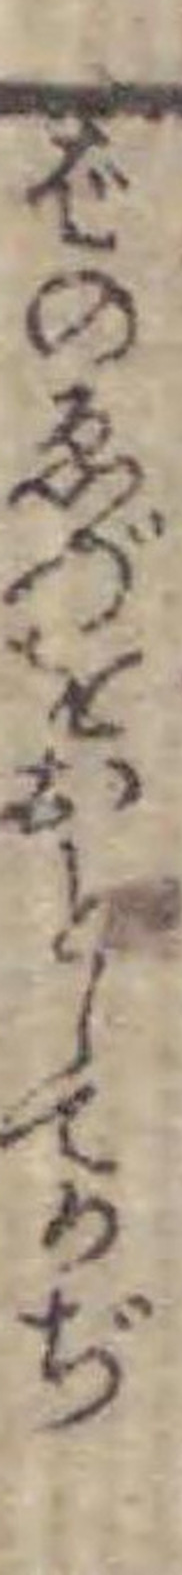ばのゑづをおとしてかぢ
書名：年寄之冷水曽我 : 3巻
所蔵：国立国会図書館 National Diet Library, JAPAN
